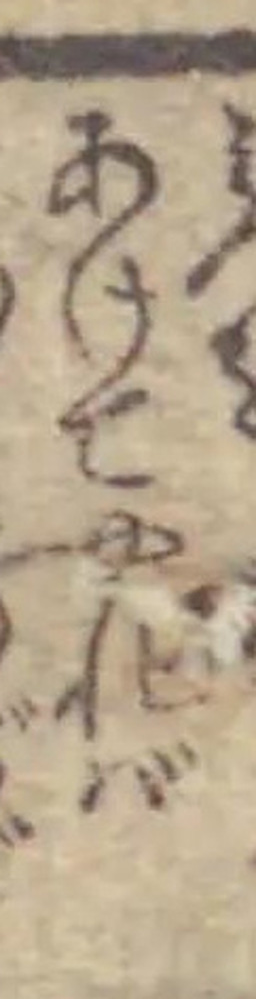あけてやれば
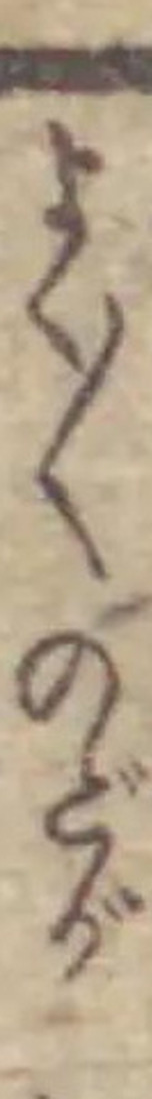よく〳〵のどが
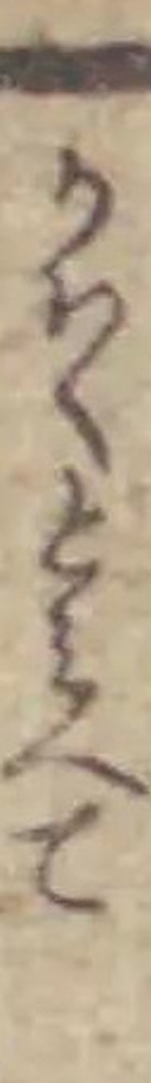かはくとみへて
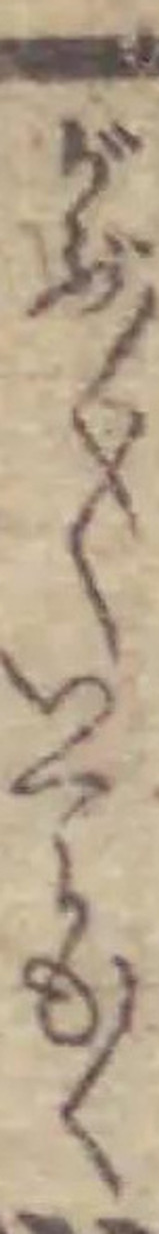がぶ〳〵〳〵いくらも〳〵
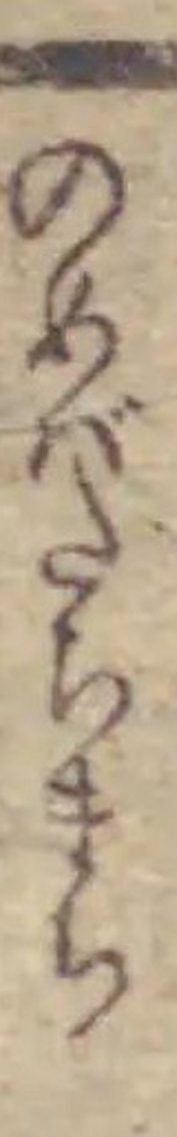のめばたちまち
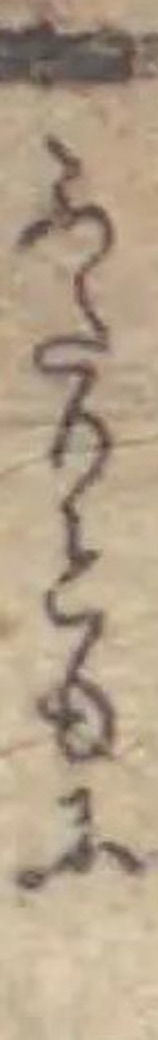ふたりともに
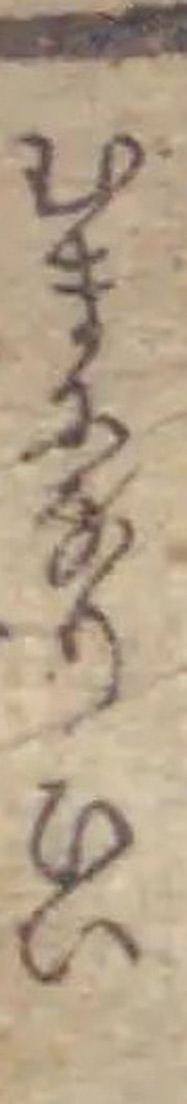むまになりひい
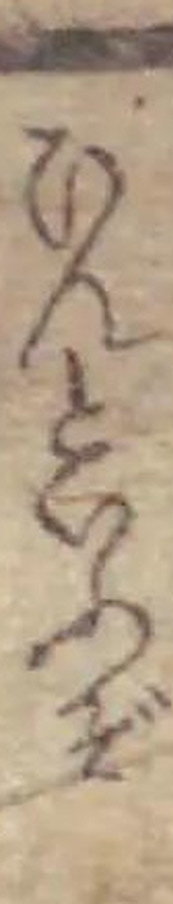ひんといふぞ
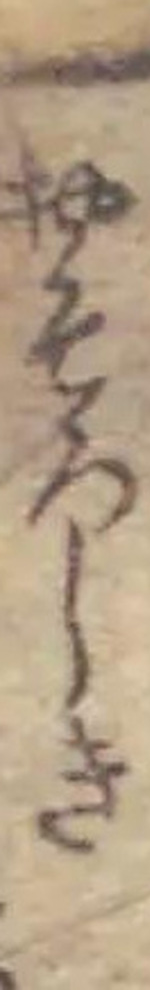おそろしき
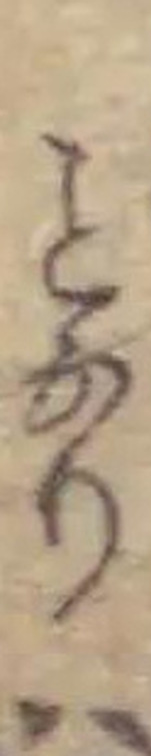ことなり

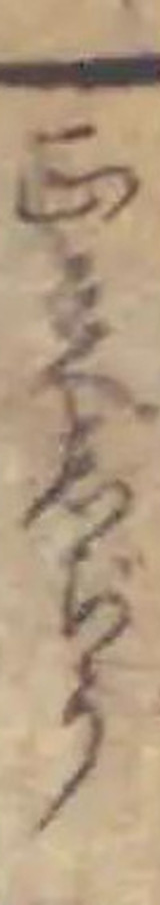正兵へしぢう
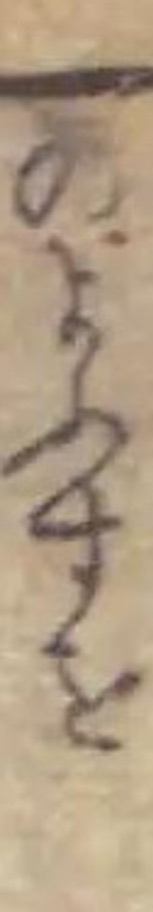のよふすを
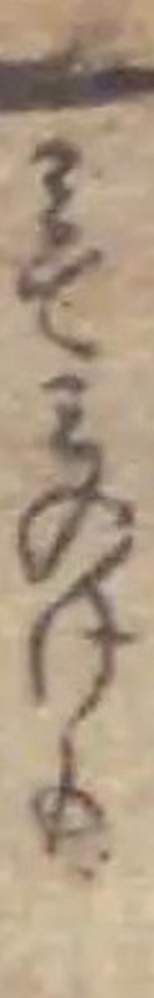みてみのけも
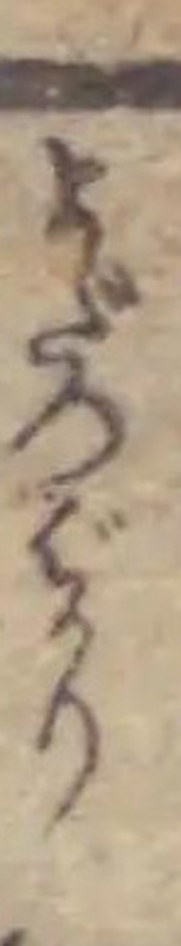よだつばかり
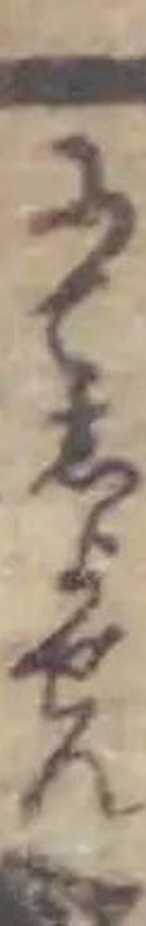にてしょせん
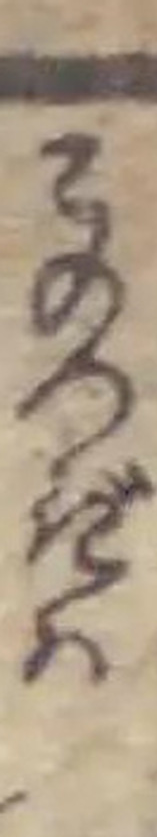このつぎは
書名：もふもふもふ怖噺 2巻
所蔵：国立国会図書館 National Diet Library, JAPAN
